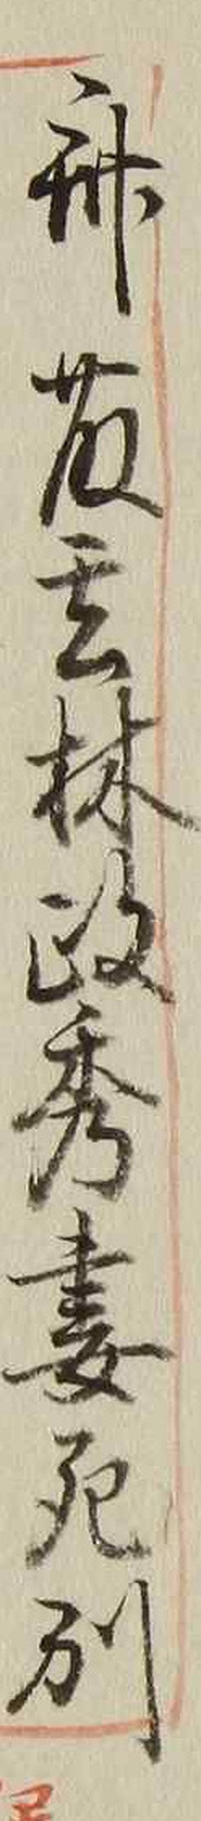養女斎藤玄林政秀死別
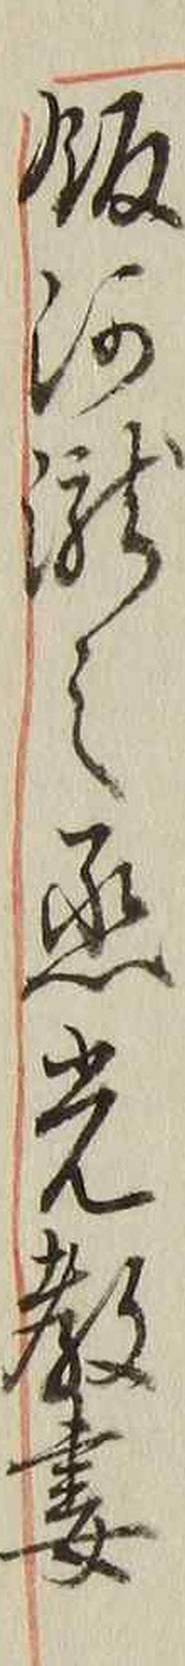飯河瀧之丞光教妻
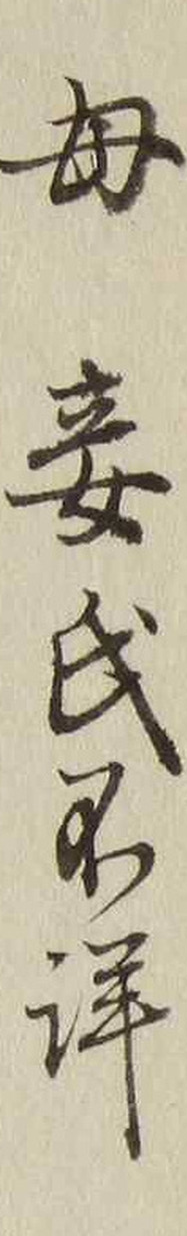母妾氏不詳

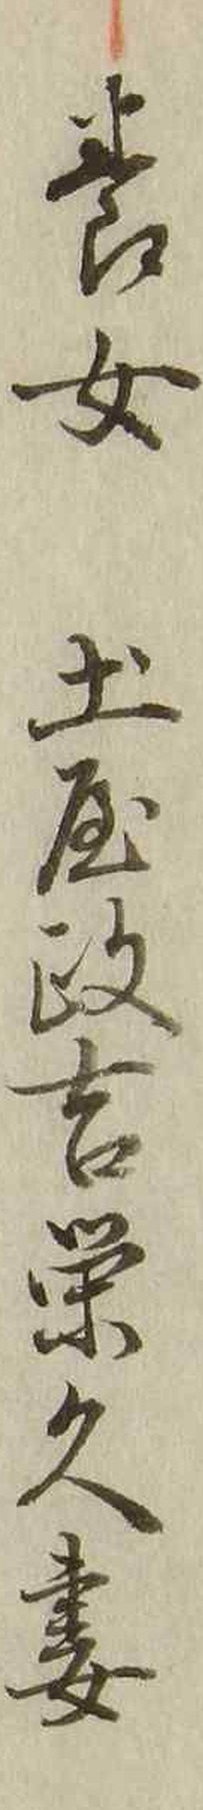養女土屋政吉栄久妻
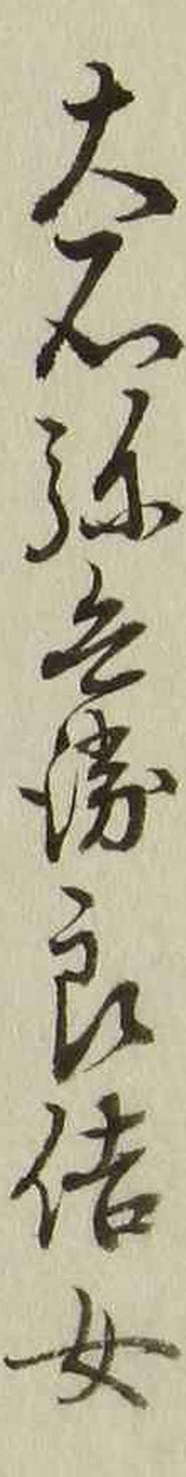実大石弥兵衛良佶女
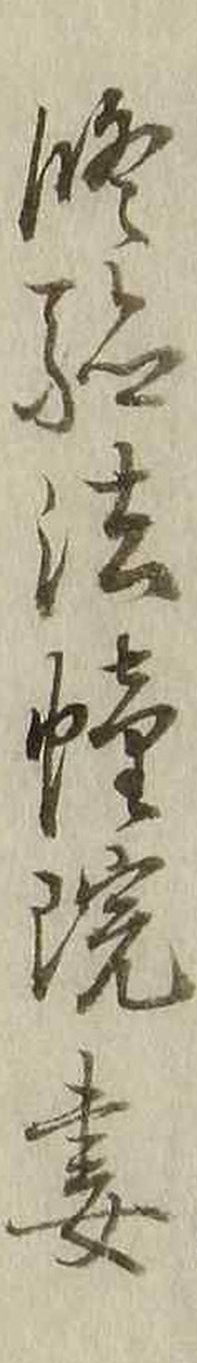修驗法幢院妻
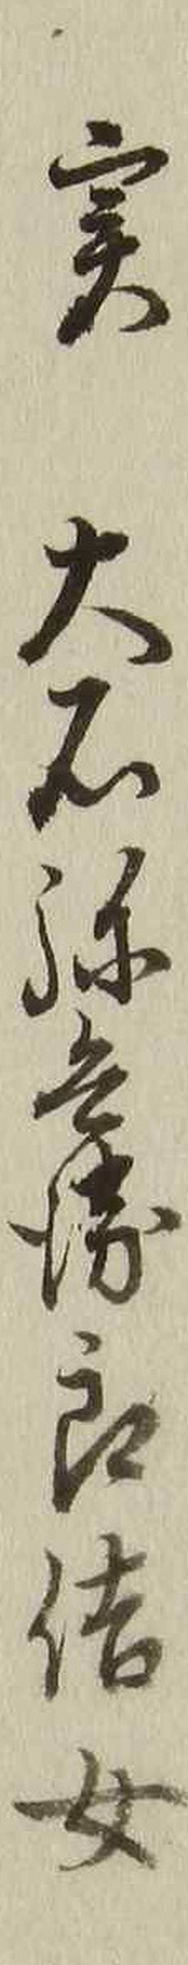実大石弥兵衛良佶女
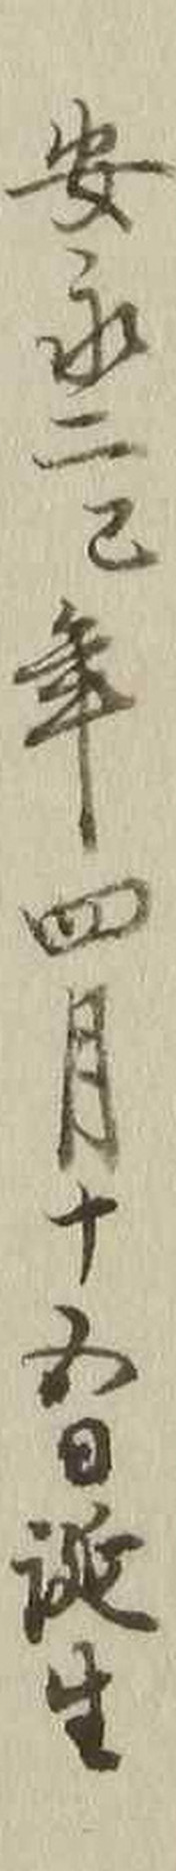安永二巳年四月十五日誕生
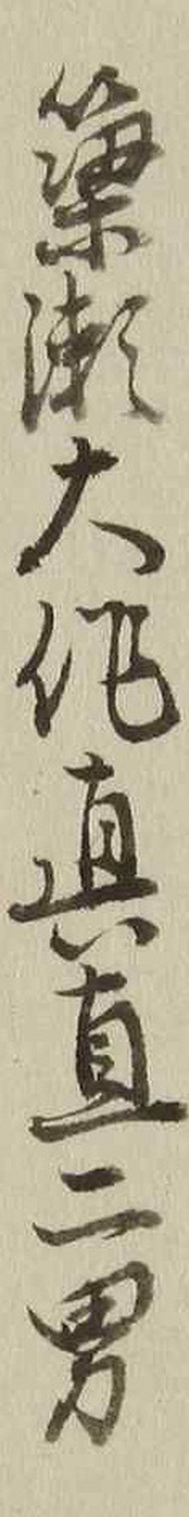実簗瀬大作真直二男
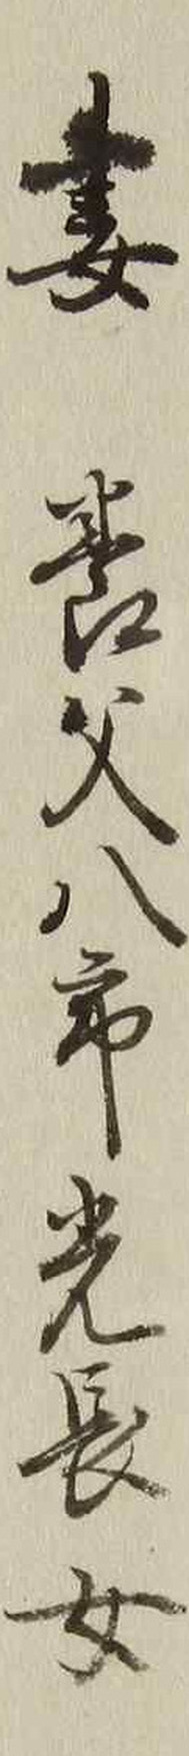妻養父八郎光長女
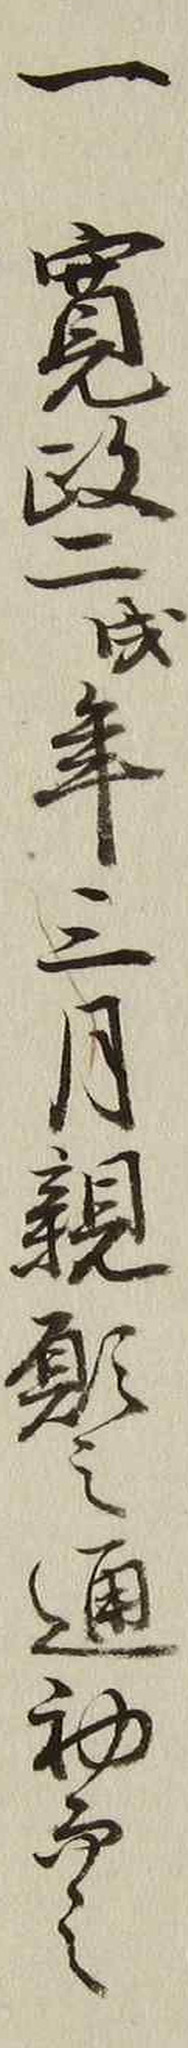一寛政二戌年三月親願之通初而之
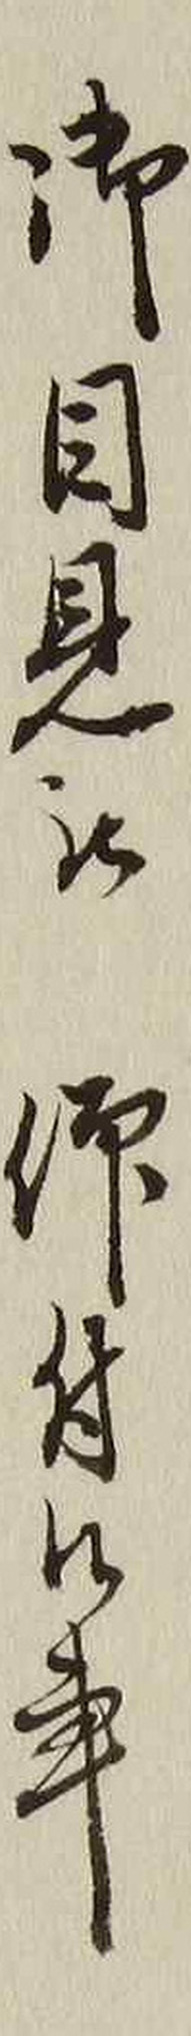御目見被仰付候事
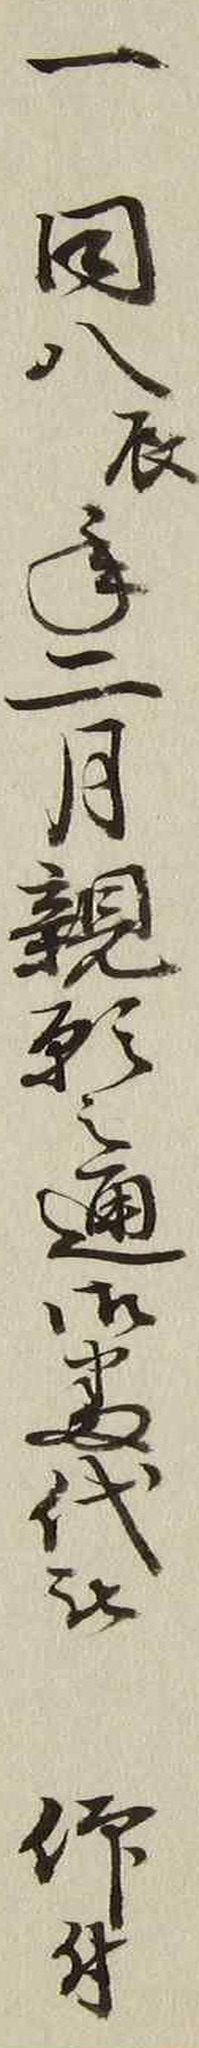一同八辰年二月親願之通御番代被仰付
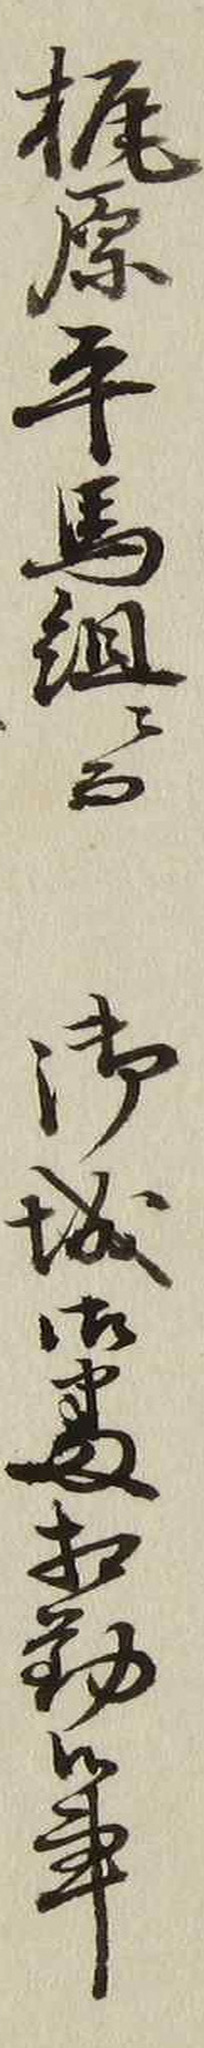梶原平馬組ニ而御城御番相勤候事
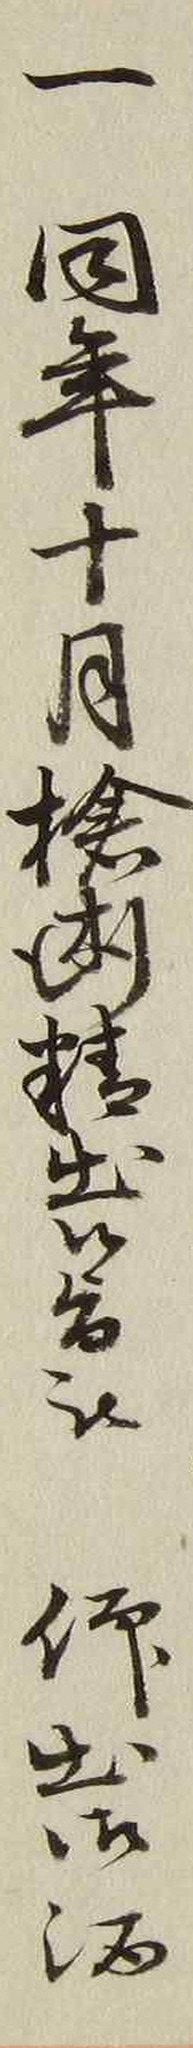一同年十月槍術精出候旨被仰出御酒
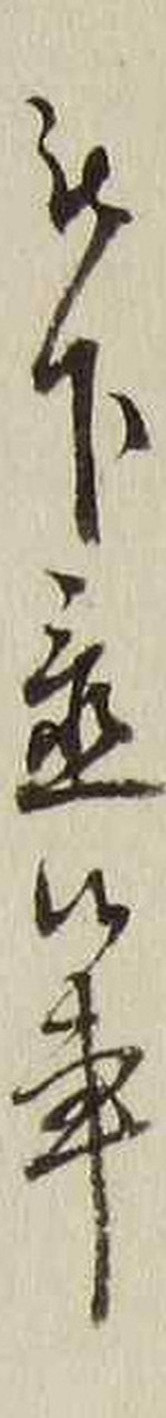被下置候事
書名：諸士系譜　巻之27　い之部27
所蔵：会津若松市立会津図書館
